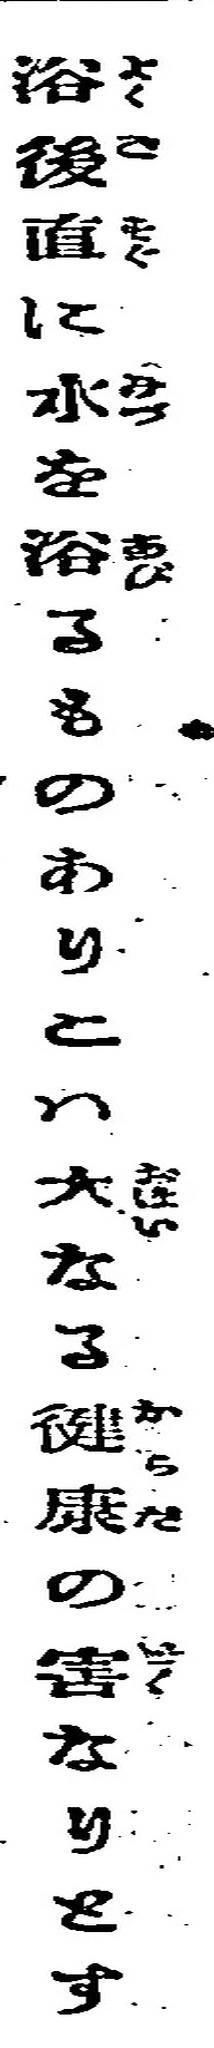浴後直に水を浴るものありとは大なる徤康の害なりとす
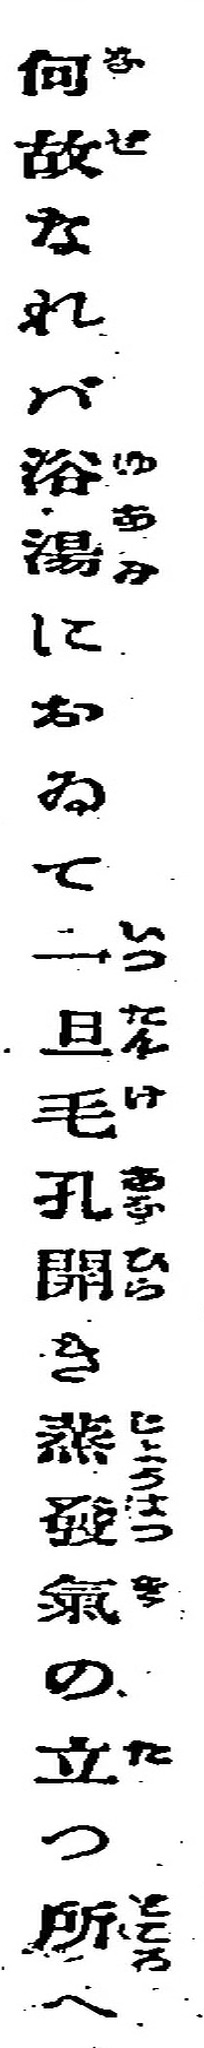何故なれば浴湯におゐて一旦毛孔開き蒸発氣の立つ所へ
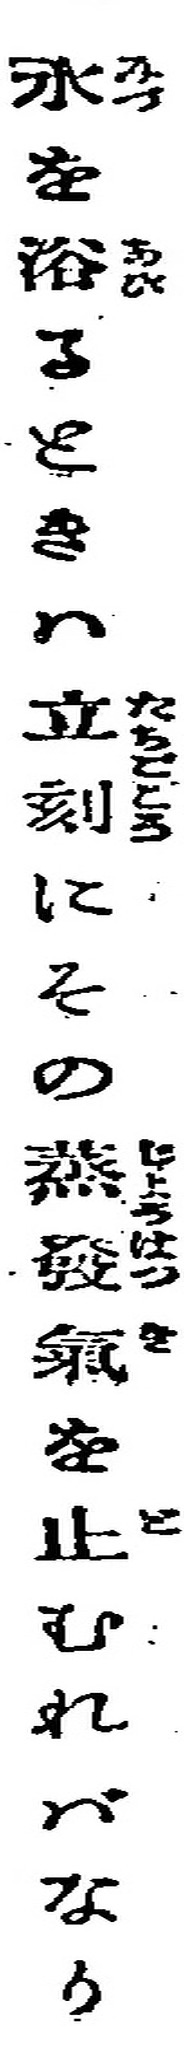水を浴るときは立刻にその蒸發氣を止むればなり
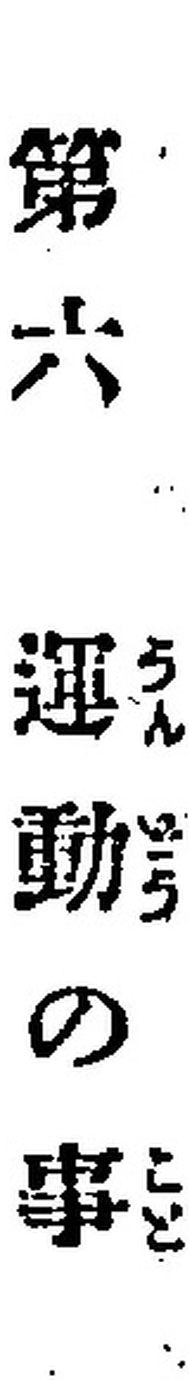第六運動の事
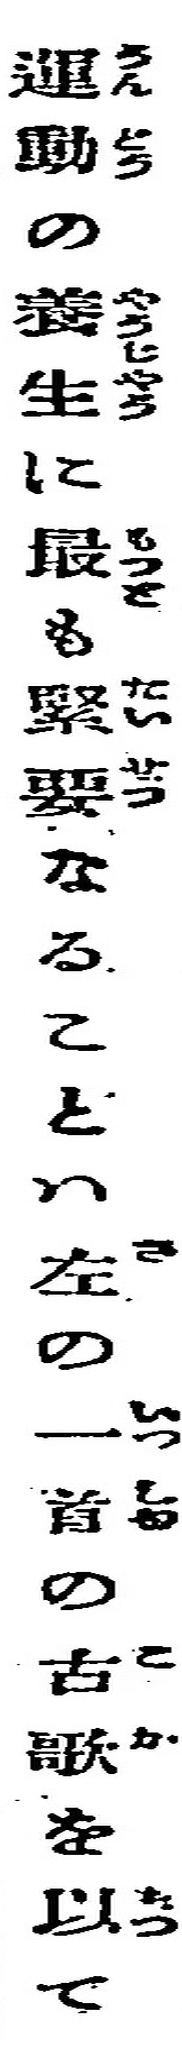運動の養生に最も緊要なることは左の一首の古歌を以て

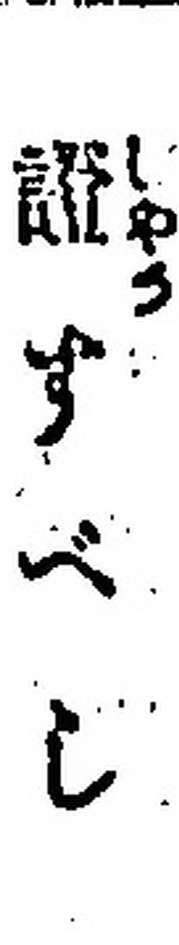證すべし
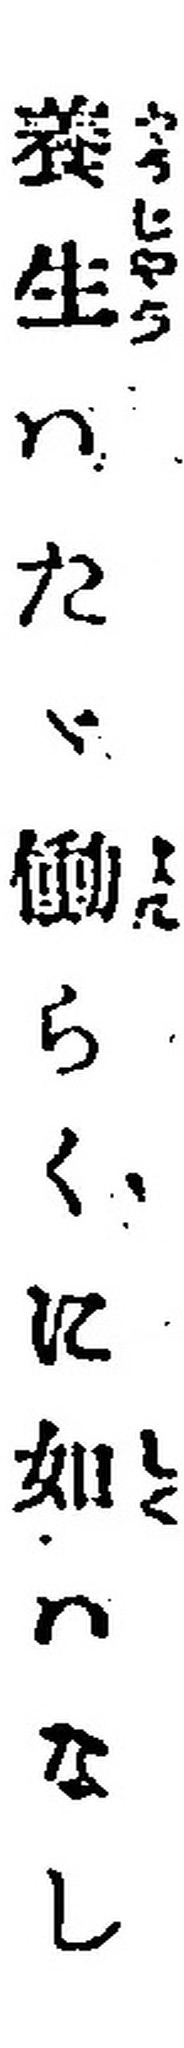養生はたゞ働らくに如はなし
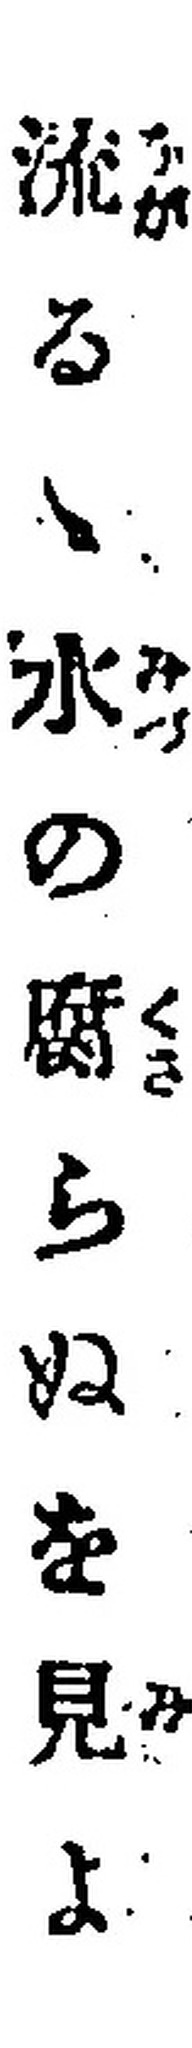流るゝ水の腐らぬを見よ
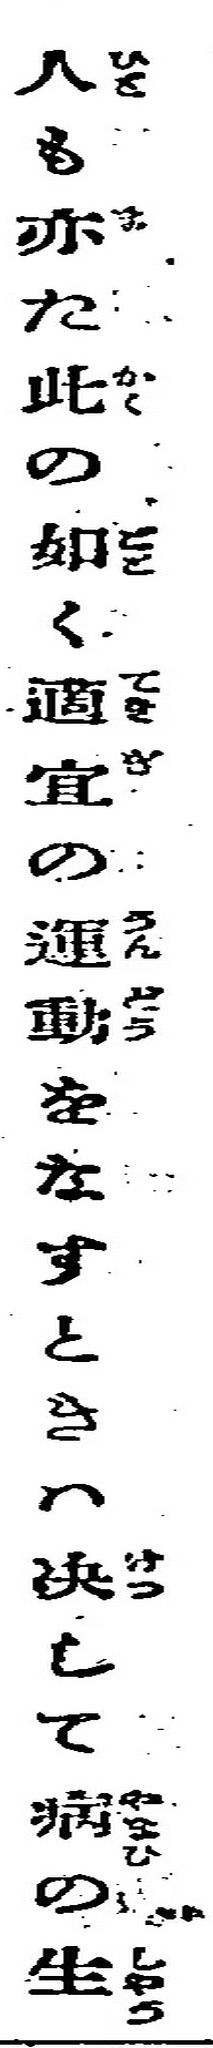人も亦た此の如く適宜の運動をなすときは決して病の生
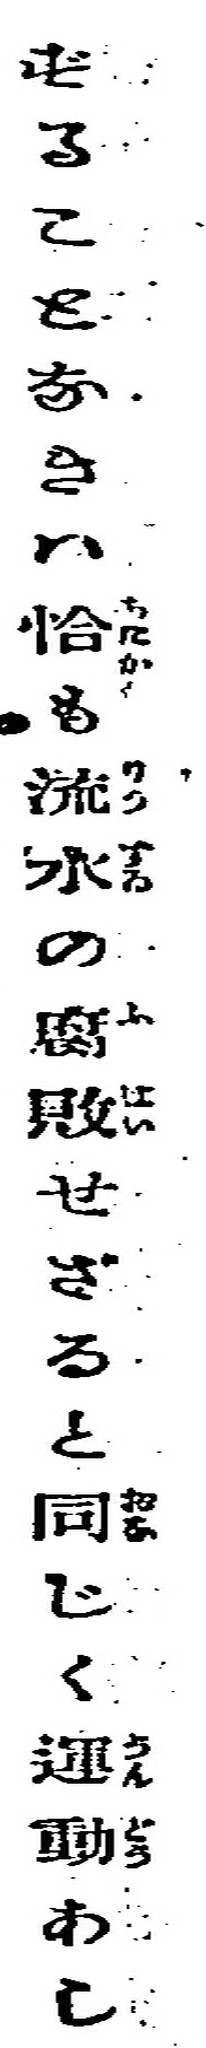ずることなきは恰も流水の腐敗せざると同じく運動あし
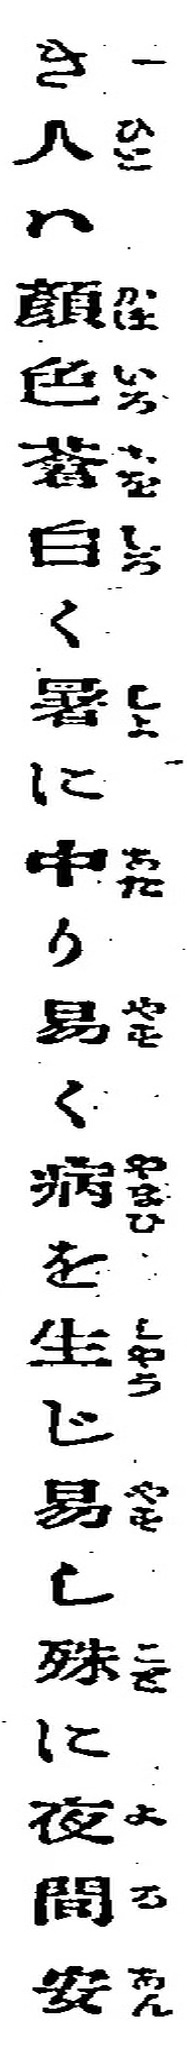き人は顔色蒼白く暑に中り易く病を生じ易し殊に夜間安
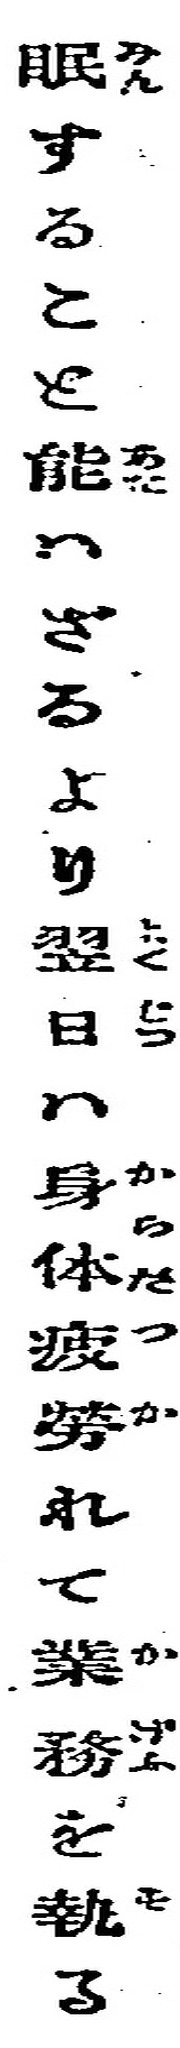眠すること能はざるより翌日は身体疲労れて業務を執す
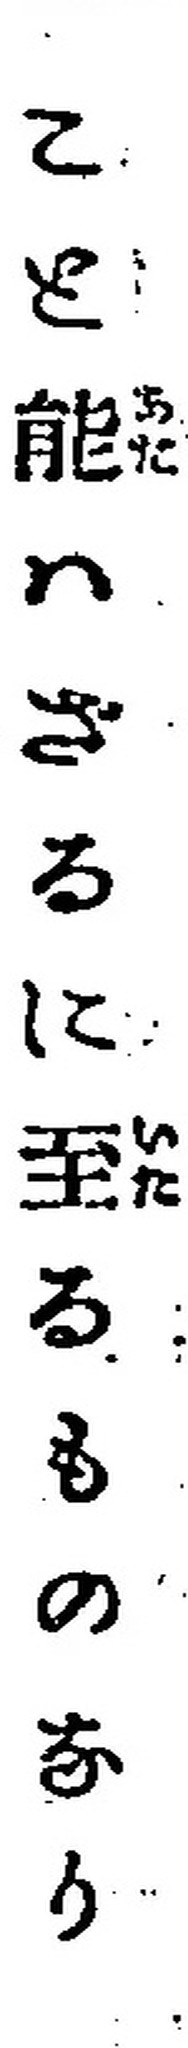こと能はざるに至るものなり
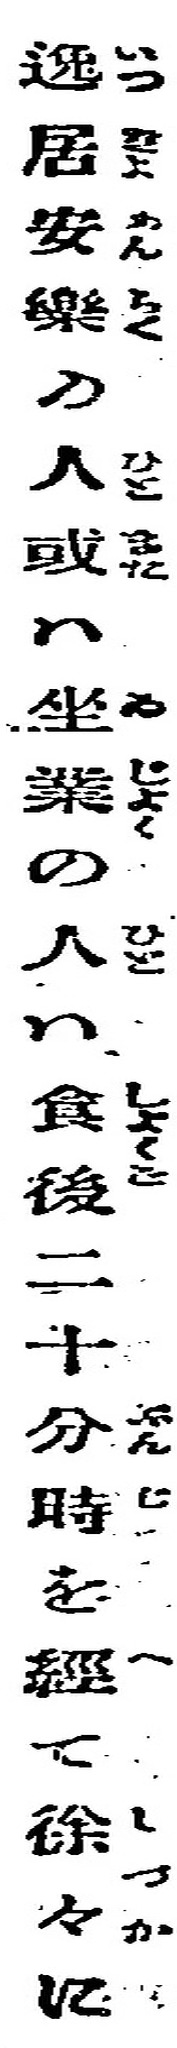逸居安楽の人或は坐業の人は食後二十分時を経て徐々に
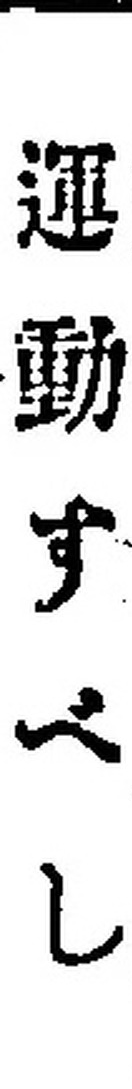運動すべし
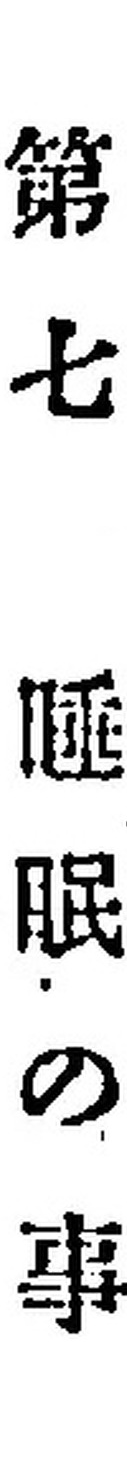第七睡眠の事
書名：新撰暑中養生法 : 附・コレラ予防歌
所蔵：国立国会図書館 National Diet Library, JAPAN
